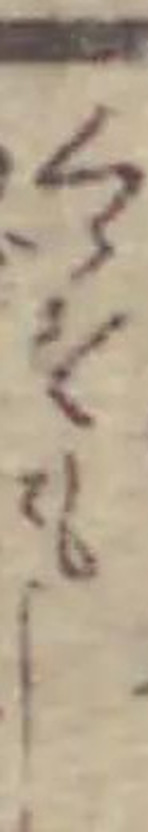くらすも
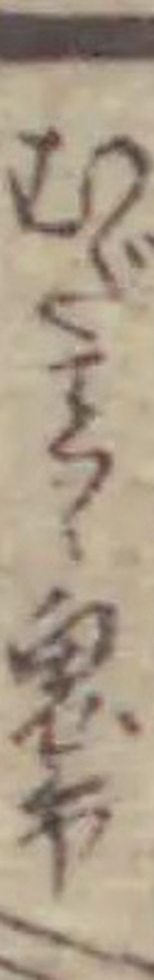むだことゝ鬼市
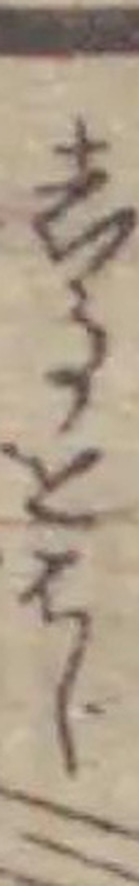し事をはじ
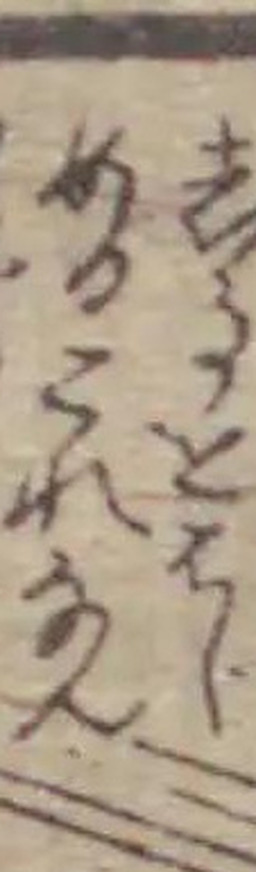めるこれなん
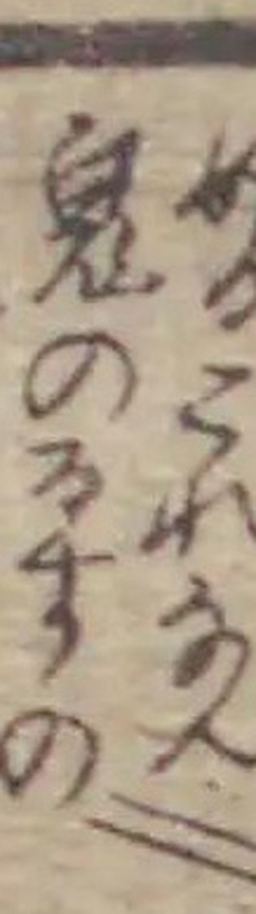鬼のるすの
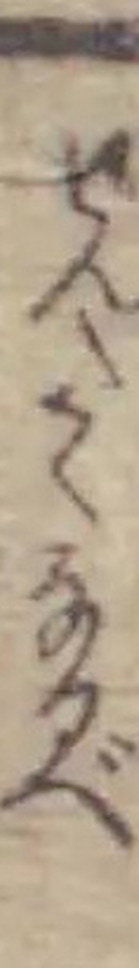せんたくなるべし
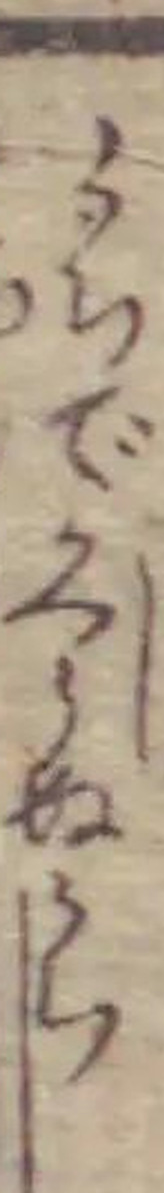うちでかへらぬうち
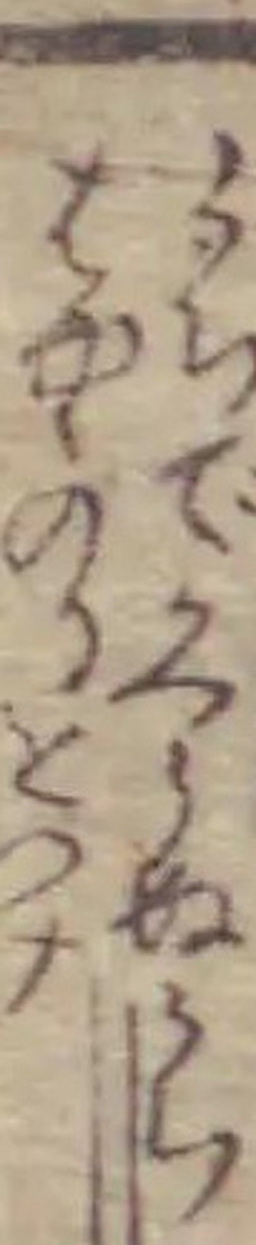はやくのりをつけ
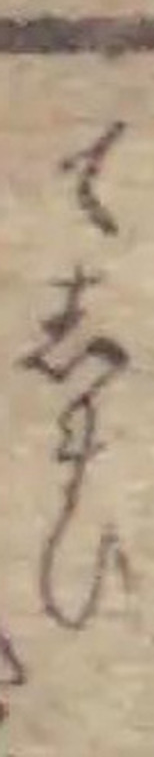てしまひ

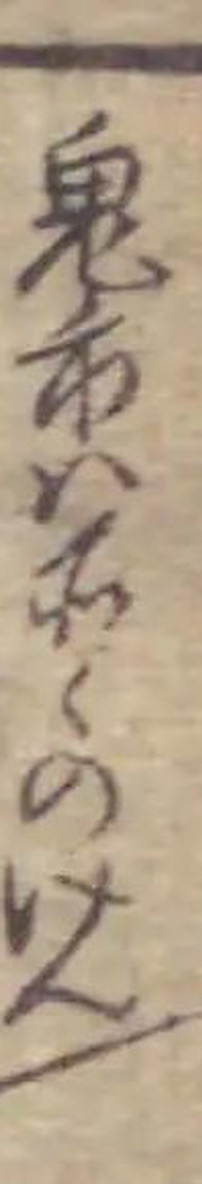鬼市は所々のけん
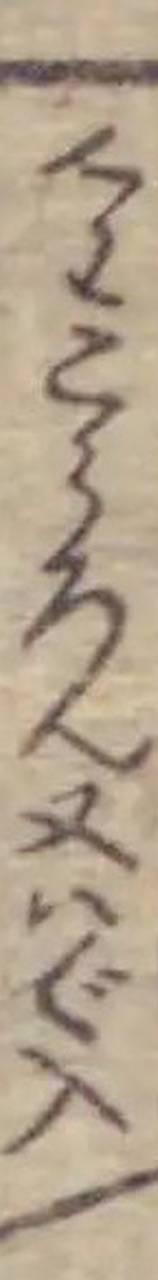くわこうろん又はで入
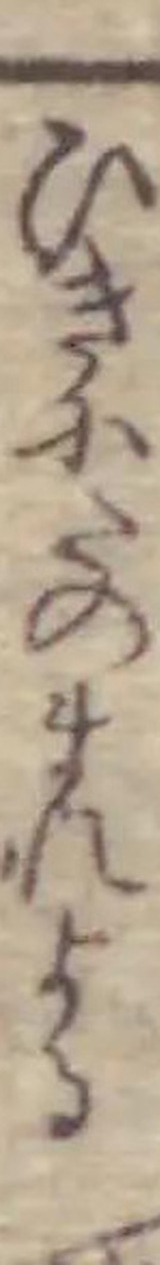ひきにたのまれよる
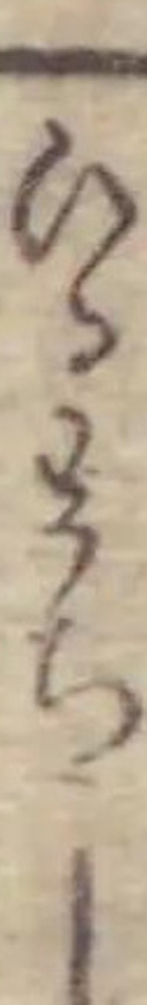ひるわかち
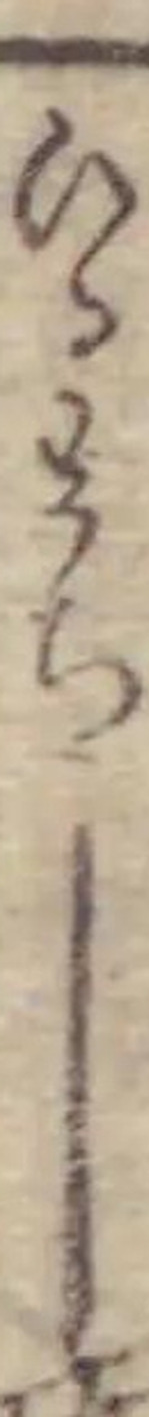ひるわかち
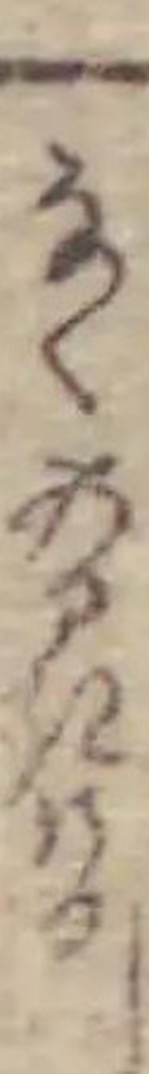なくあるきける
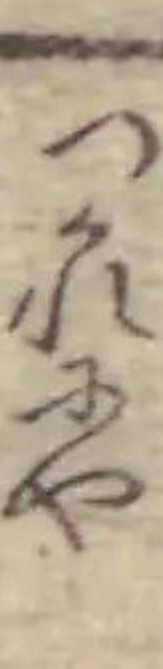つかれにや
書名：鬼子宝 3巻
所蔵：国立国会図書館 National Diet Library, JAPAN
